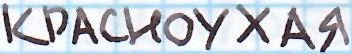красноухая
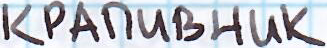крапивник
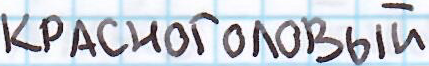красноголовый
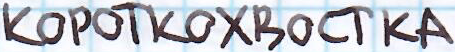короткохвостка
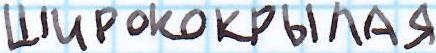ширококрылая
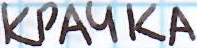крачка
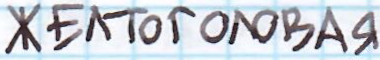желтоголовая
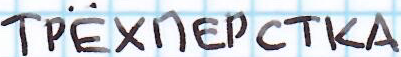трёхперстка
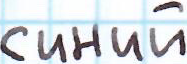синий
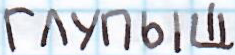глупыш
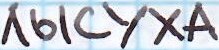лысуха
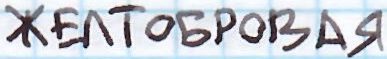желтобровая
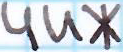чиж
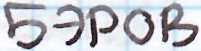бэров
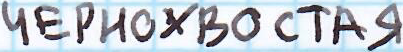чернохвостая
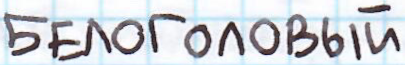белоголовый
